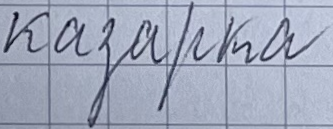казарка
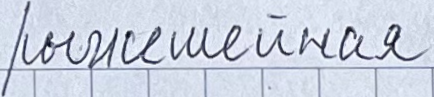рыжешейная
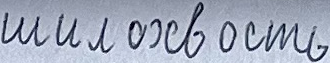шилохвость
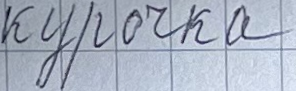курочка
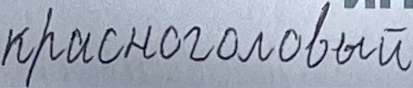красноголовый
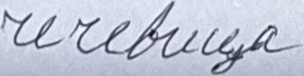чечевица
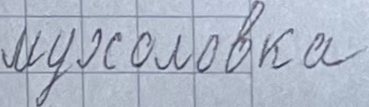мухоловка
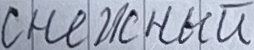снежный
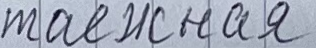таежная
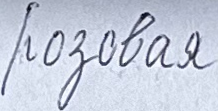розовая
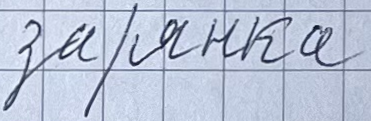зарянка
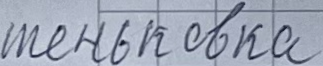теньковка
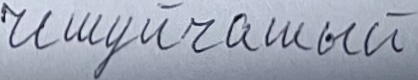чешуйчатый
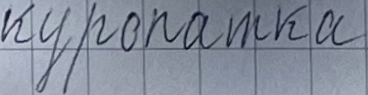куропатка
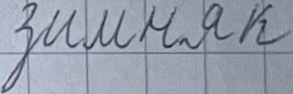зимняк
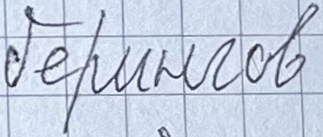берингов
